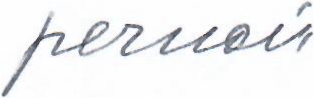речной
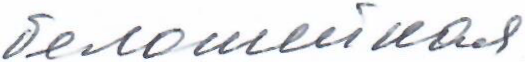белошейная
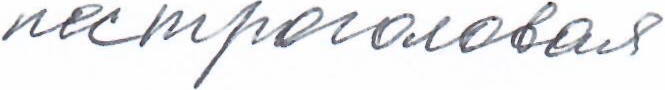пестроголовая
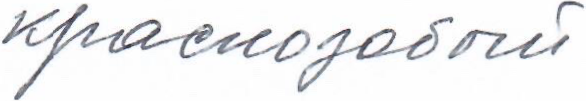краснозобый
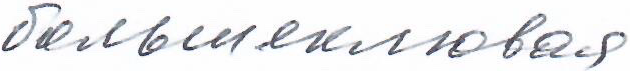большеклювая
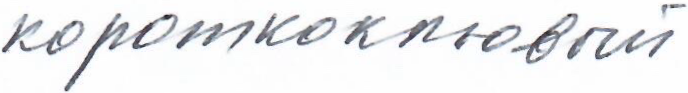короткоклювый
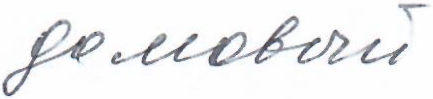домовый
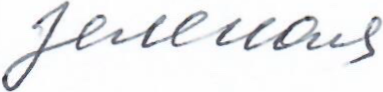зеленая
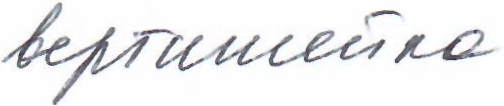вертишейка
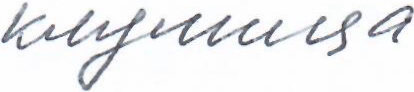клушица
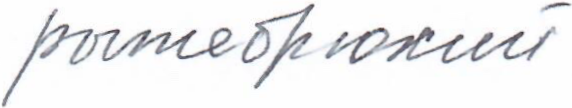рыжебрюхий
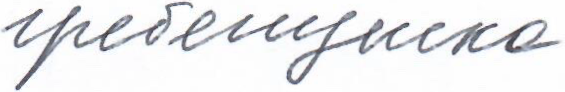гребенушка
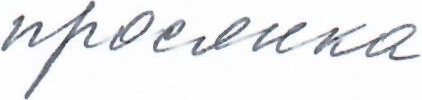просянка
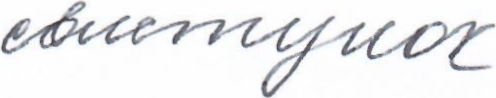свистунок
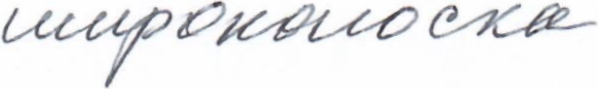широконоска
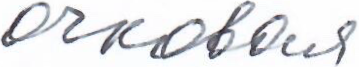очковая
